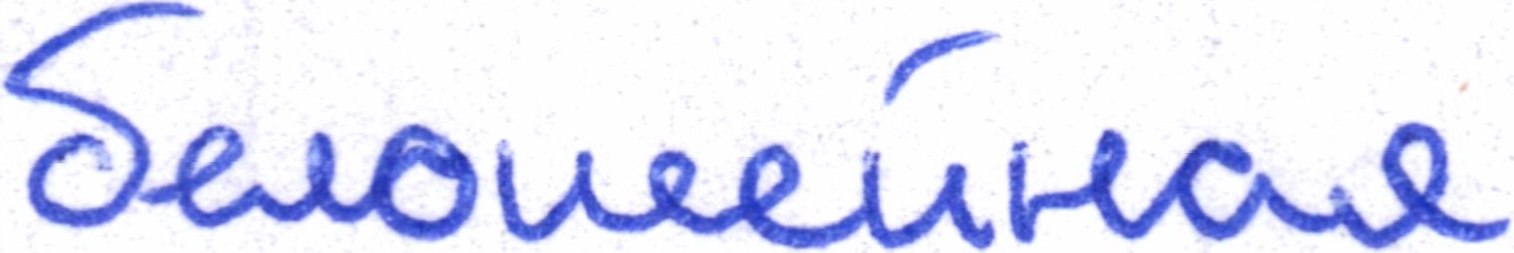белошейная
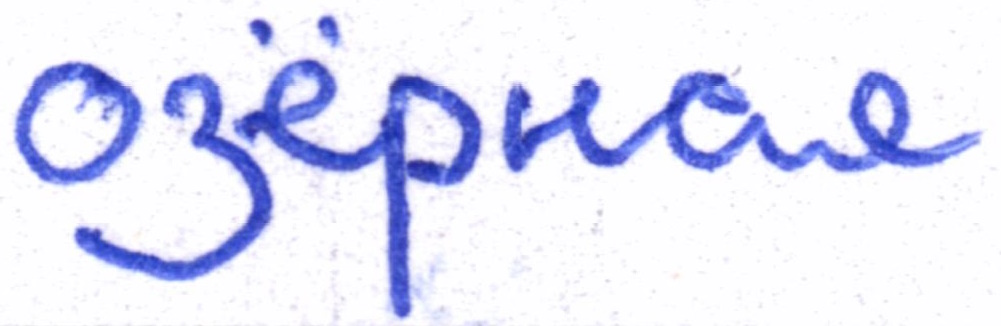озёрная
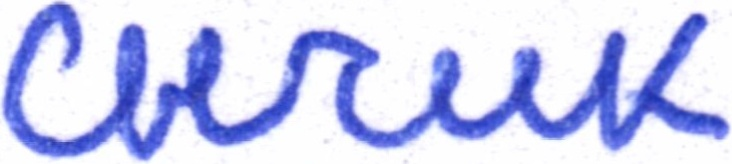сычик
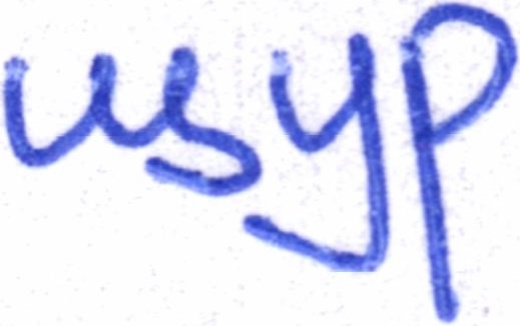щур
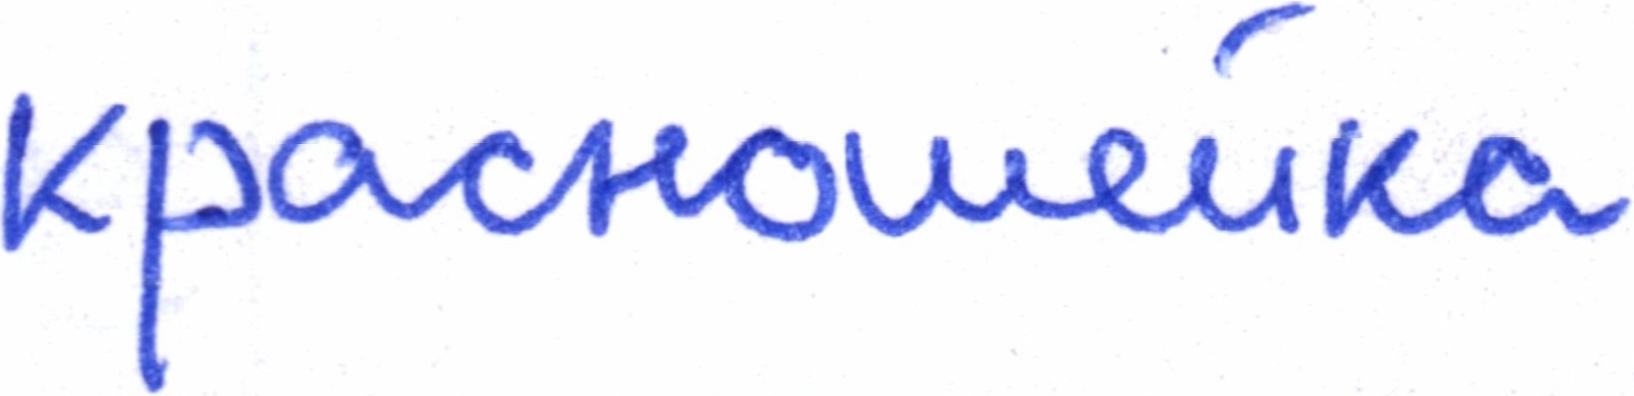красношейка
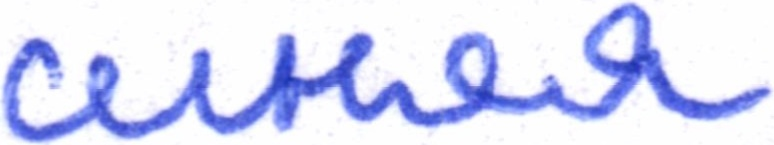синяя
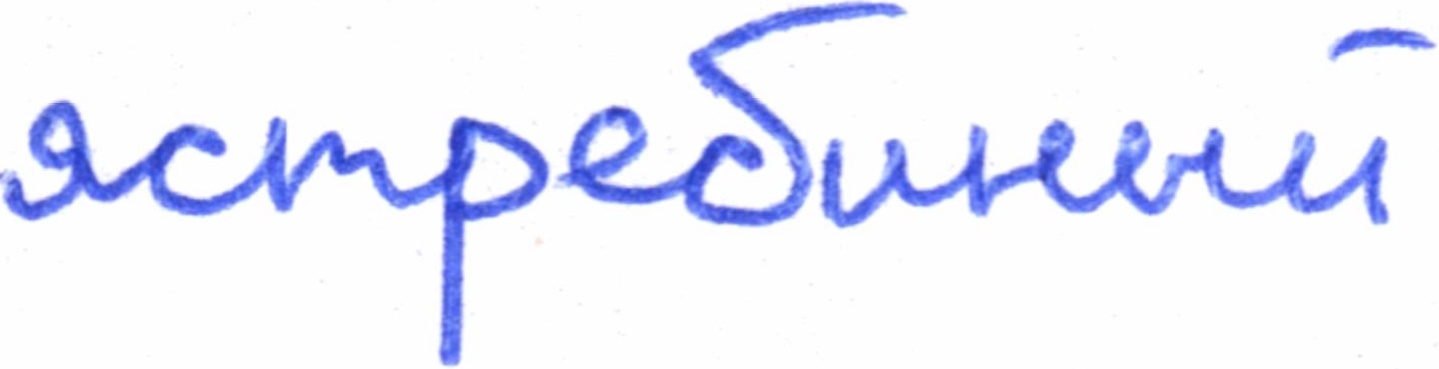ястребиный
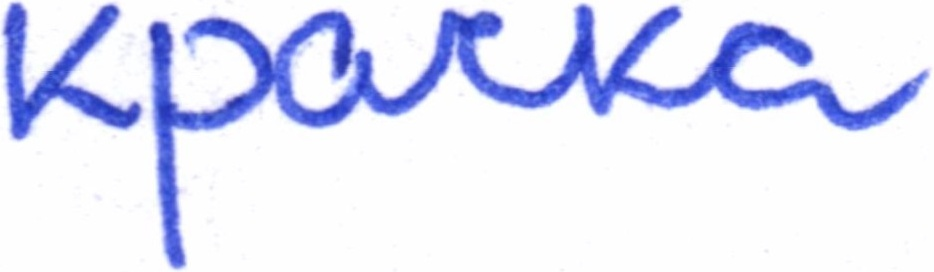крачка
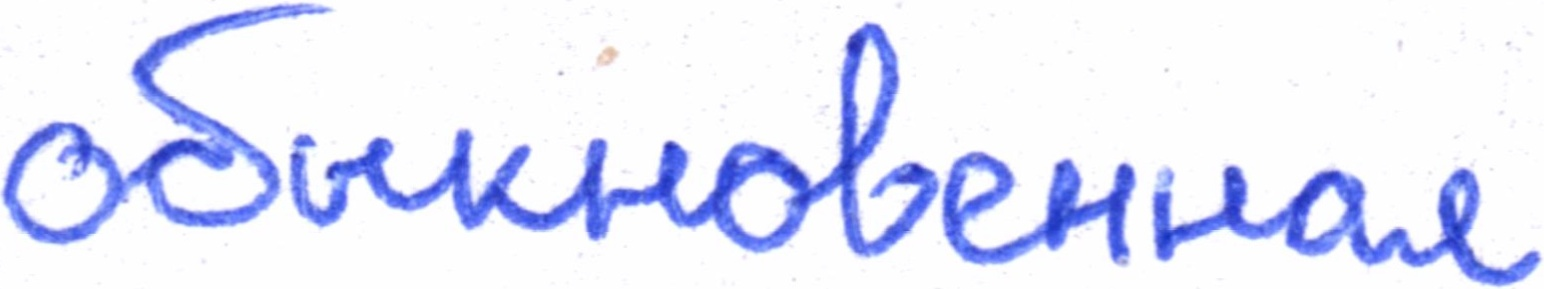обыкновенная
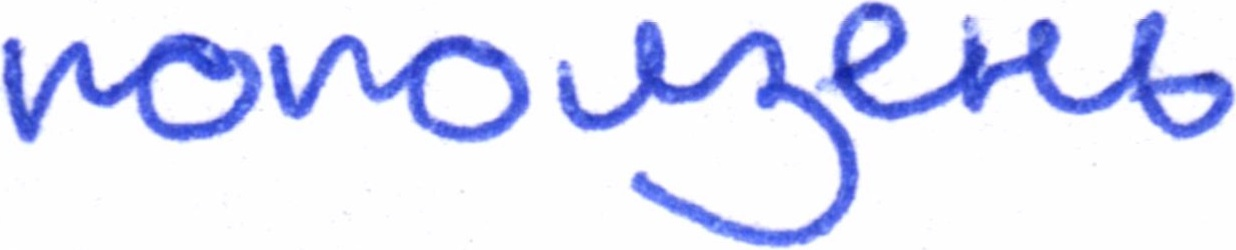поползень
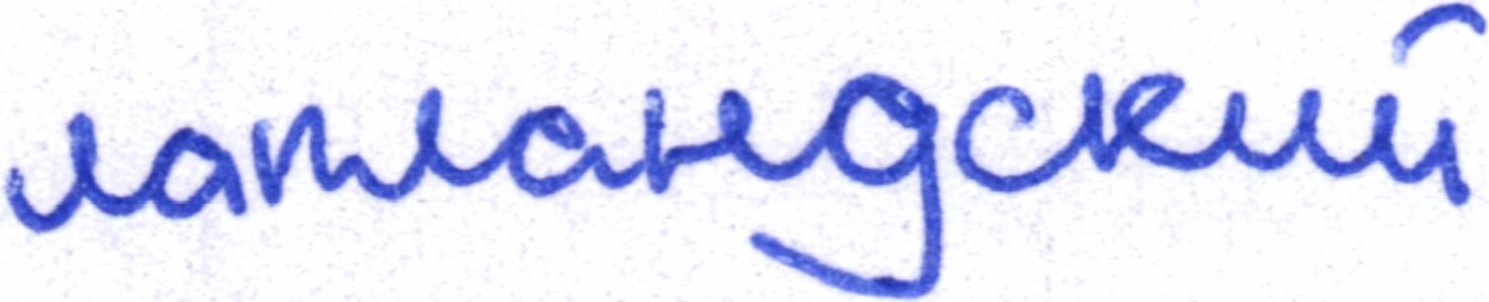лапландский
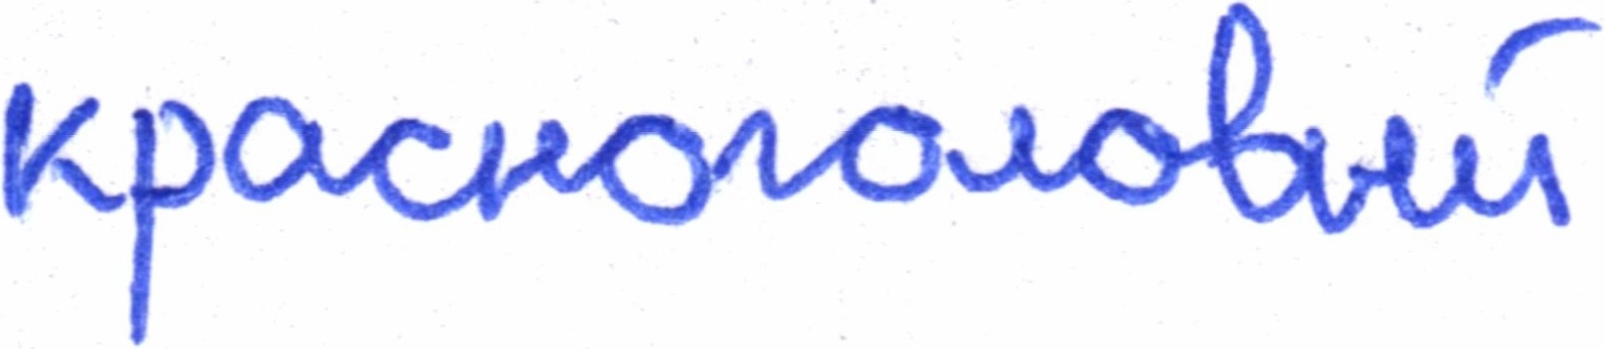красноголовый
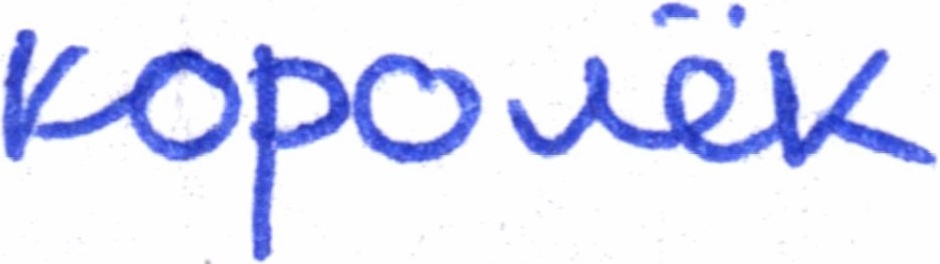королёк
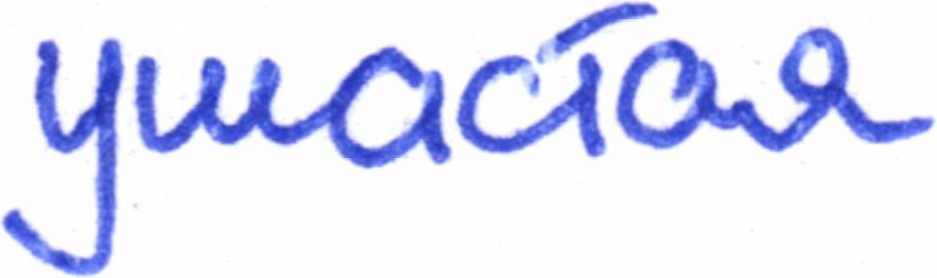ушастая
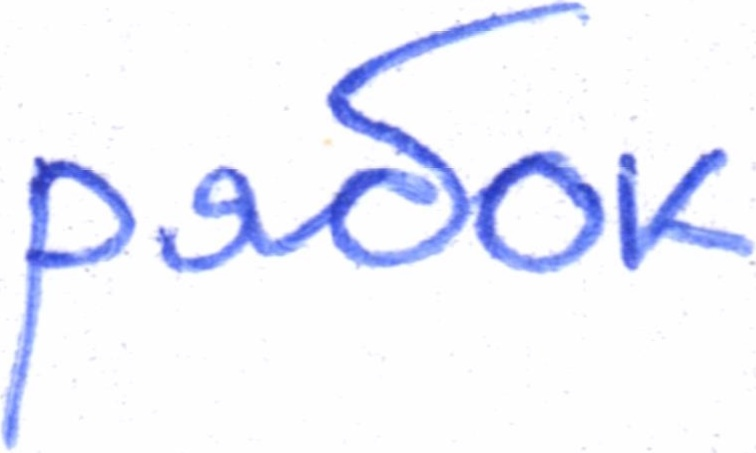рябок
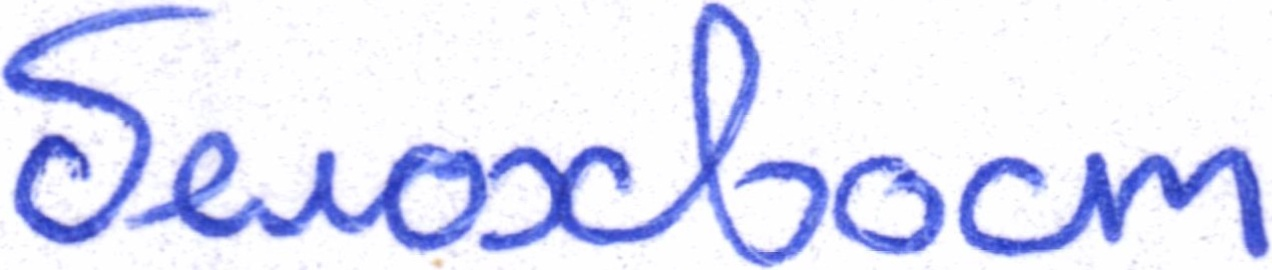белохвост
